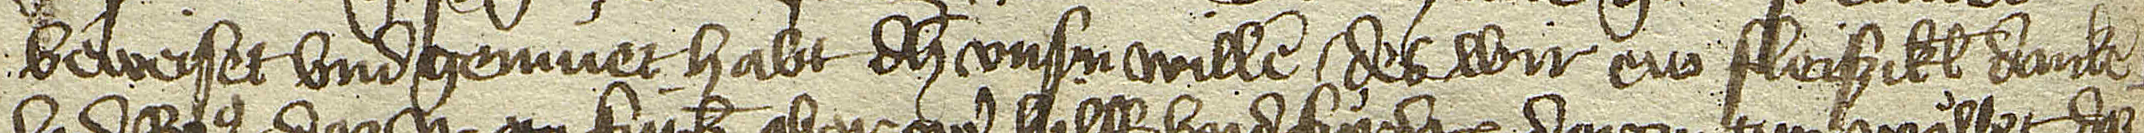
beweiſet vnd gemüet habt d*h vnſ*n wille* / des wir ew fleiſʒikl* danke*
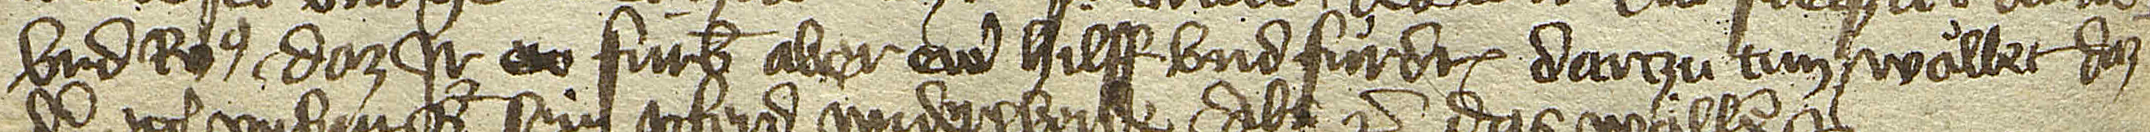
vnd Ro* / daʒ Ir ew fürb* aber ew* hilff vnd fürdr* darcʒu tun wöllet daʒ
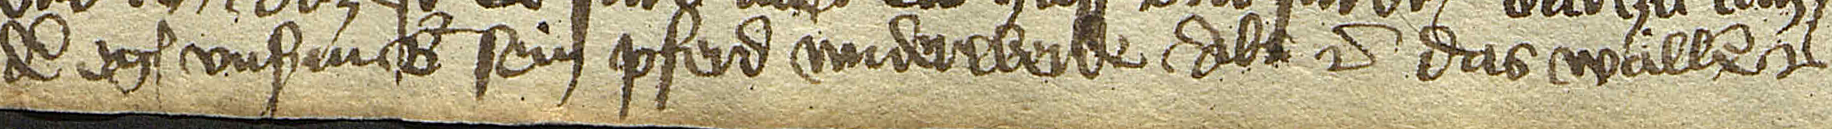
d* eg* vnſ*m B* ſein pferd widerwerde / Als ec* das wölle* ec*
